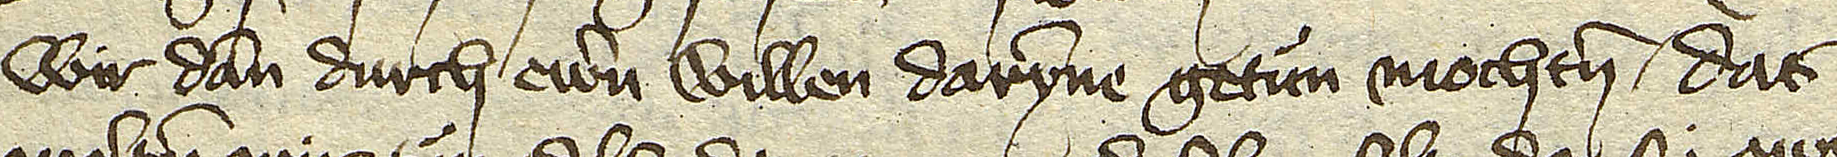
wir dan* durch ewn* willen daryne* getün mochtn* / das
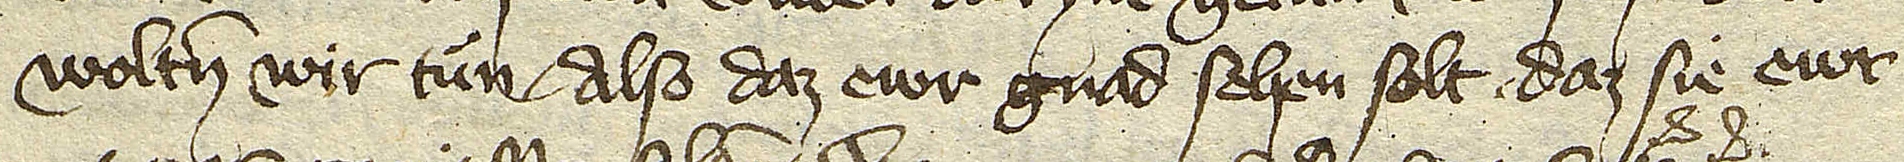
woltn* wir tün / Alſo daʒ ewr gnad ſehen ſolt / daʒ ſie ewr
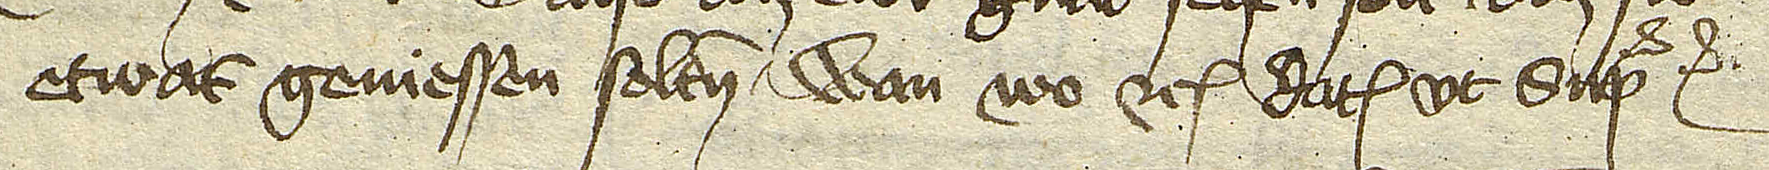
etwas genieſſen ſoltn* / Wan wo ec* dat* vt Sup* § .
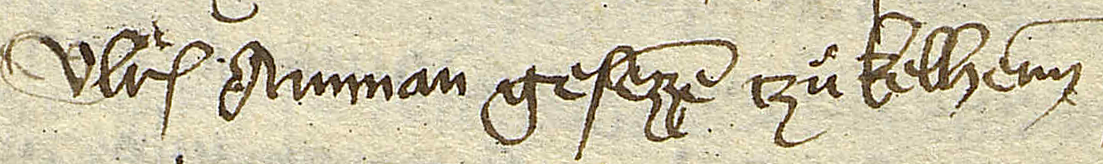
Vlr* Amman geſeʒʒe* cʒü Kelheim
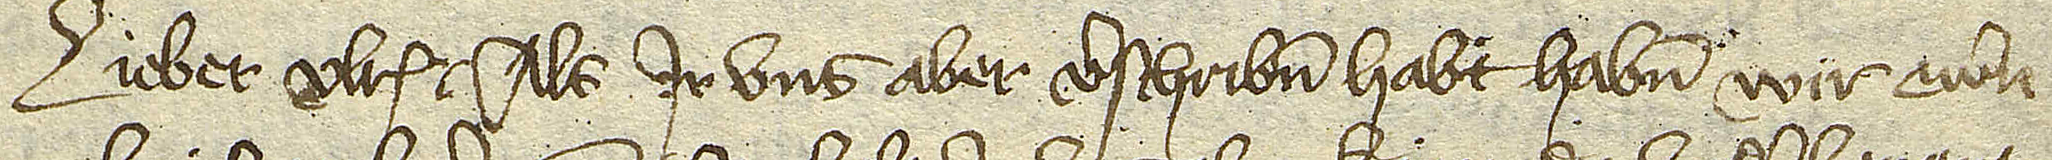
Lieber vlr* / Als Ir vns aber v*ſchribn* habt habn* wir ew*n
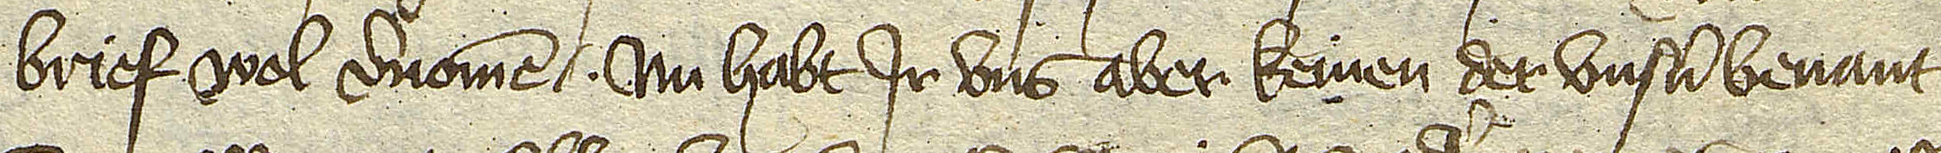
brief wol v* nome* / . Nu habt Ir vns aber keinen der vnſn* benant
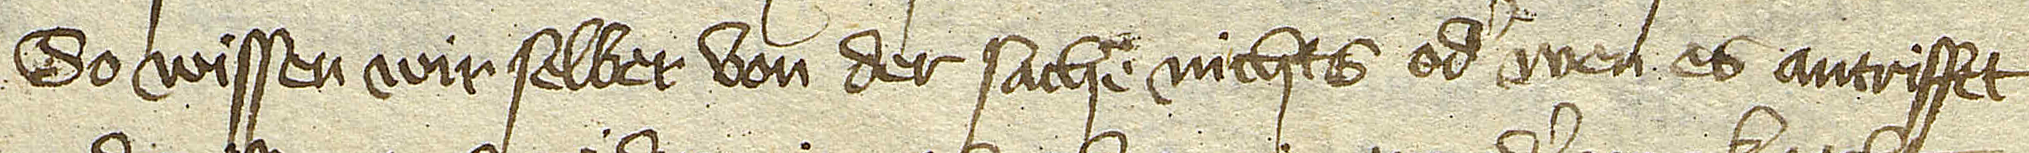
So wiſſen wir ſelber von der ſache nichts od* wen es antriffet
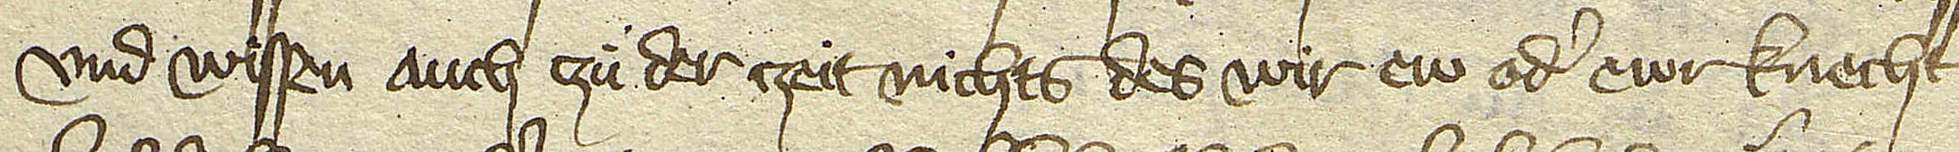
vnd wiſſen auch cʒü der cʒeit nichts des wir ew od* ewr knecht
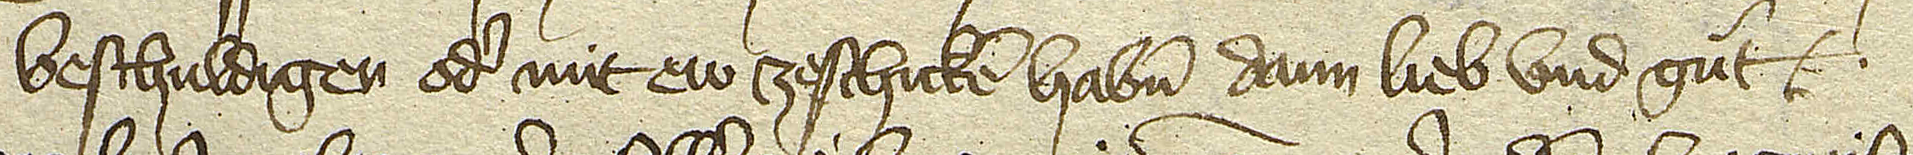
beſchuldigen od* mit ew cʒeſchicke* habn* dann lieb vnd güt / .
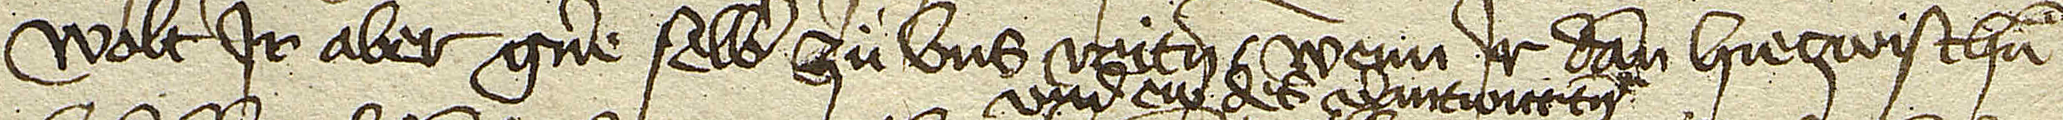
Wolt Ir aber gn*e ſelb* cʒü vns reitn* / wenn Ir dan* hiecʒwiſchn*
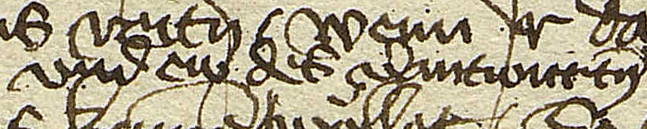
vnd ew des v*antwürtn*
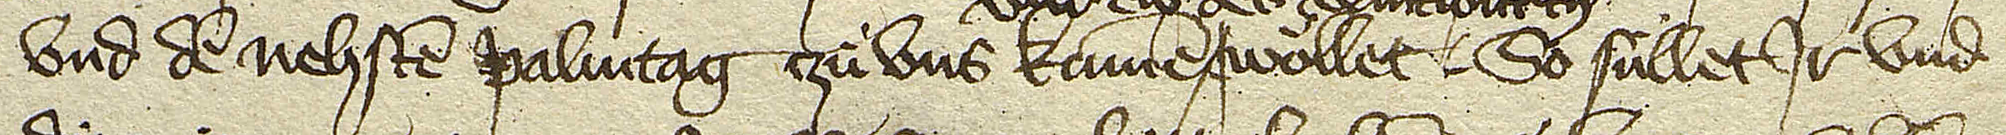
vnd d* nehſte palmtag cʒü vns kome* wöllet / So ſüllet Ir vnd
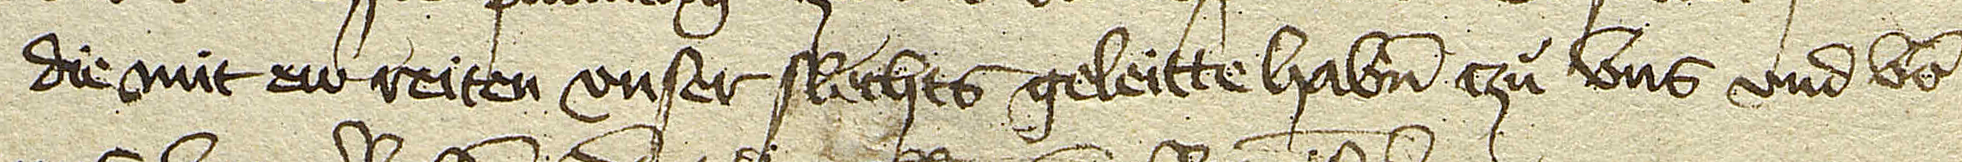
die mit ew reiten vnſer ſlechts geleitte habn* cʒü vns vnd vo*
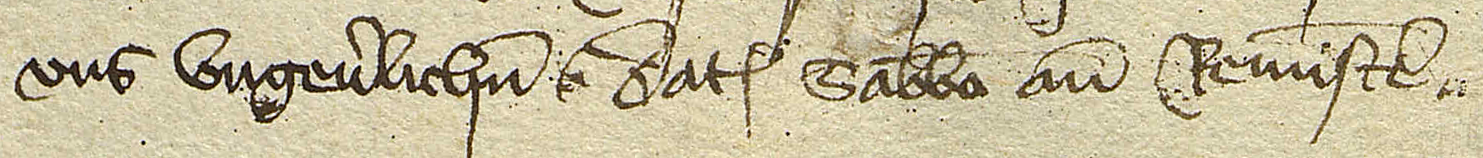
vns vngeu*lichn* / Dat* Sabbo* an* Remiſce* .
